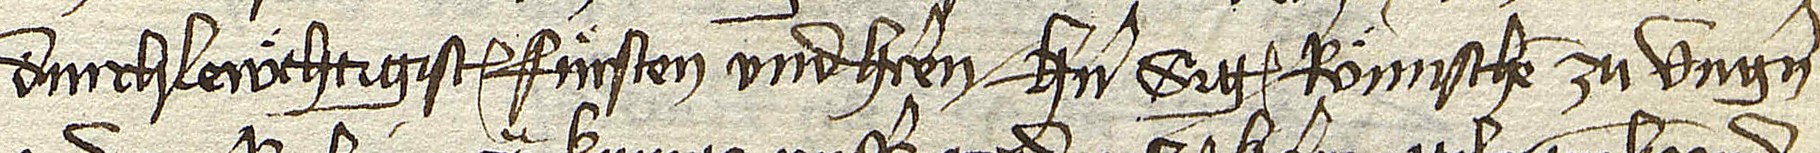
durchlewchtigiſt* fürſten vnd hr*en / Hn* Sig* Römiſche* ʒu Vng*n
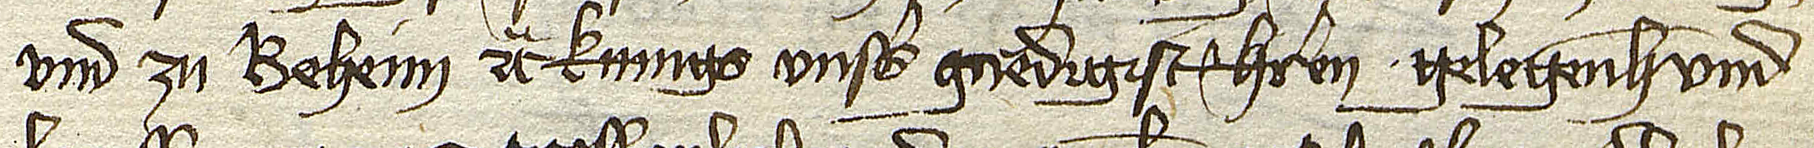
vnd ʒu Beheim ec* kunigs vnſs* gnedigiſt* hr*en . gelegenh* vnd
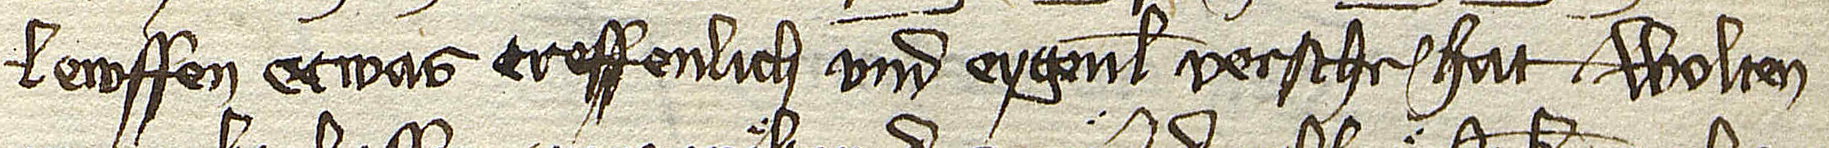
lewffen etwas treffenlich vnd eygenl* verſchr* hat / Wolten
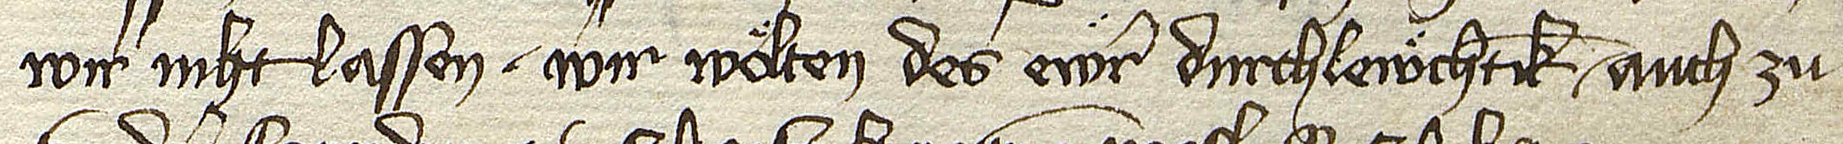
wir niht laſſen / wir wölten des ewr* durchlewchtik* / auch ʒu
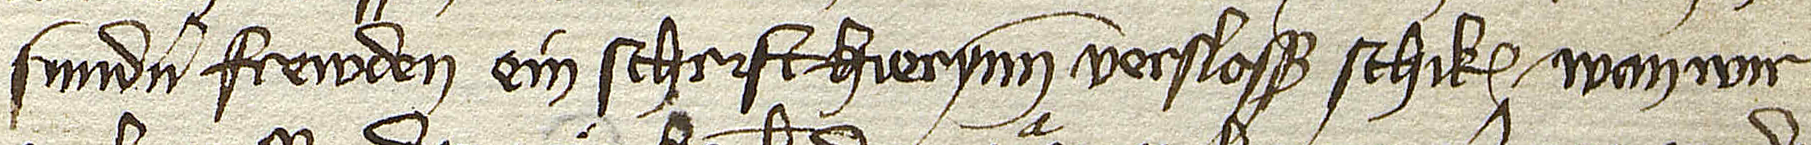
ſundn* frewden ein ſchrift hierynn* verſloſſ* ſchik* / wan wir
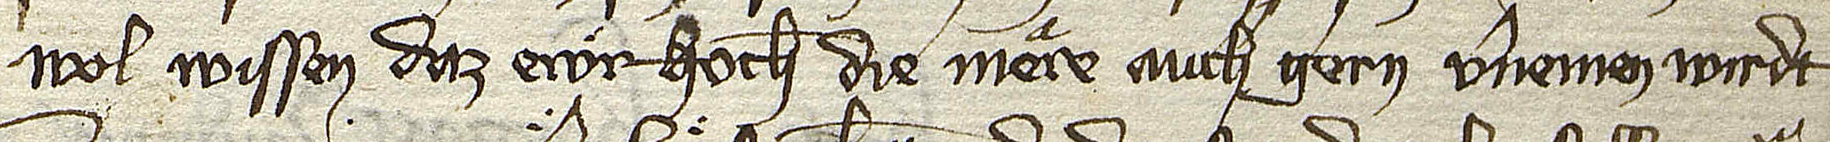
wol wiſſen daʒ ewr Hoch* die mëre auch gern v*nemen wirdt
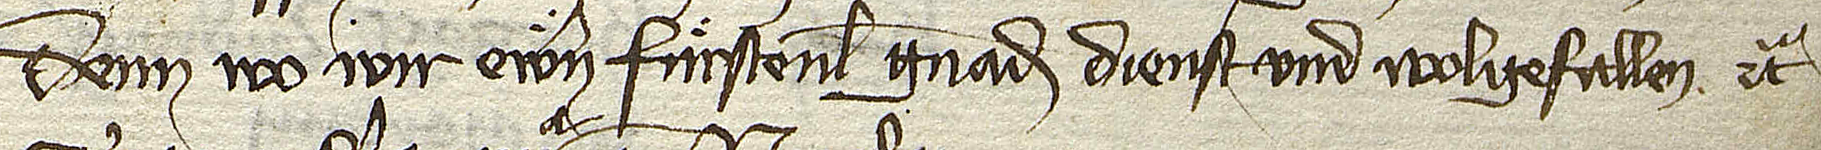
Denn wo wir ewn* fürſtenl* gnad* dienſt vnd wolgefallen ec*
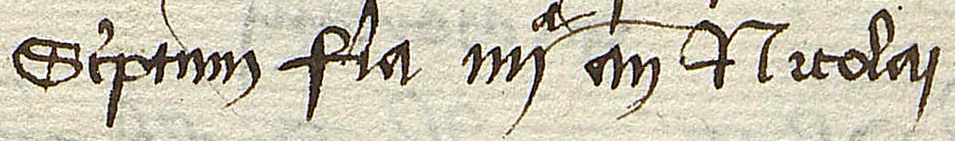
Sc*ptum fi*a iiii* an* Nicolai
